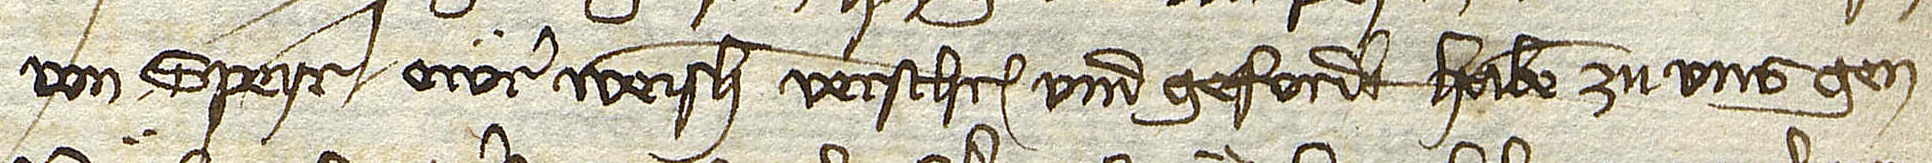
von Speyr / ewr weiſh* verſchr* vnd gefordt habe* ʒu vns gen
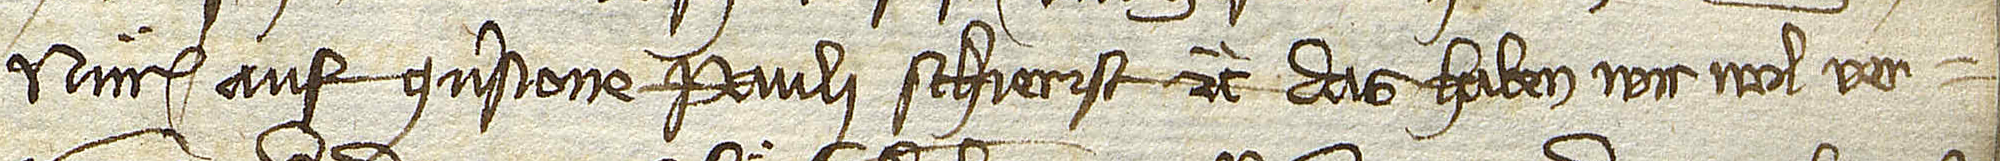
Nür* auf *u*ſione Pauli ſchieriſt ec* das haben wir wol ver =
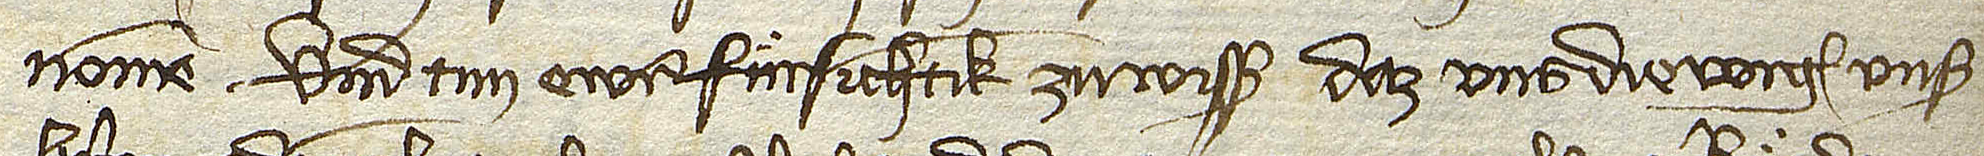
nome* . Vnd tun ew*r fürſichtik* ʒuwiſſ* daʒ vns die vorg* vnſ*
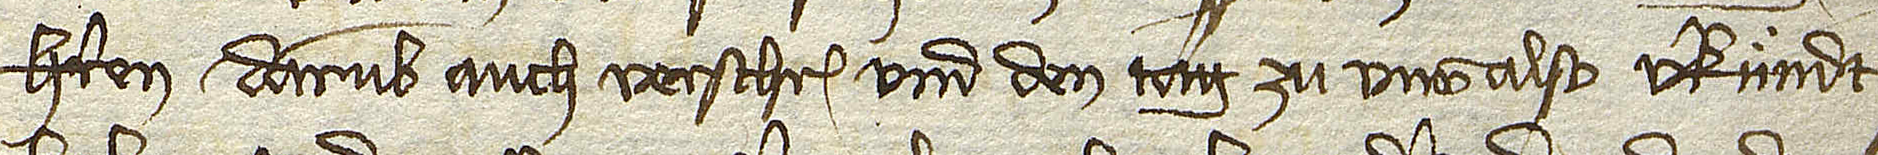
h*ren / daru*b auch verſchr* vnd den tag ʒu vns alſo v*kündt
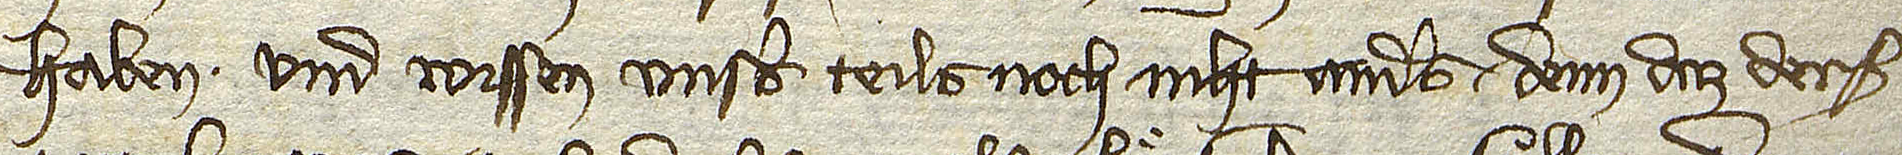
haben . vnd wiſſen vnſ*s teils noch niht and*s / denn daʒ derſ*
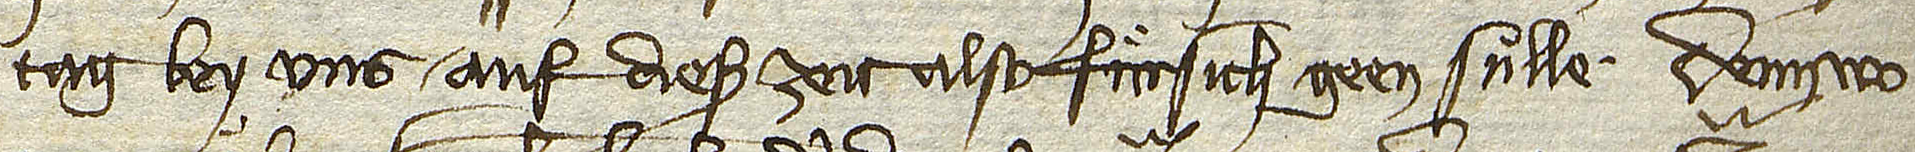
tag bey vns / auf dieſ* ʒeit alſo fürſich geen ſülle . Denn wo
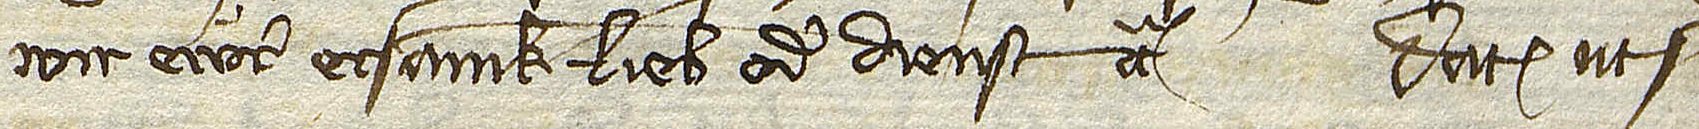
wir ew*r erſamk* lieb od* dienſt ec* Dat* ut ſ*
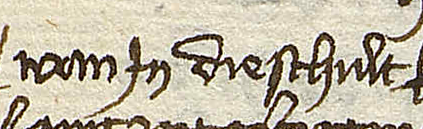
wan In die ſchult
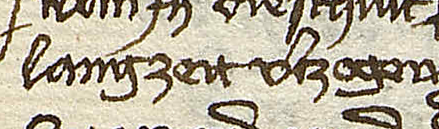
langʒeit v*ʒogen
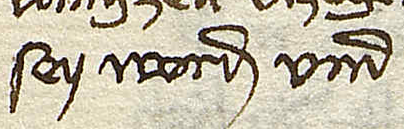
ſey word* vnd
